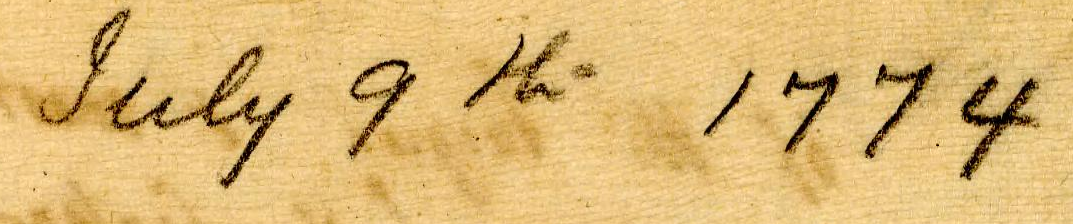July 9^th 1774
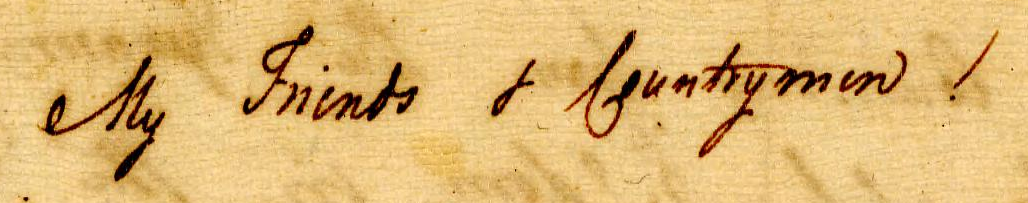My Friends & Countrymen
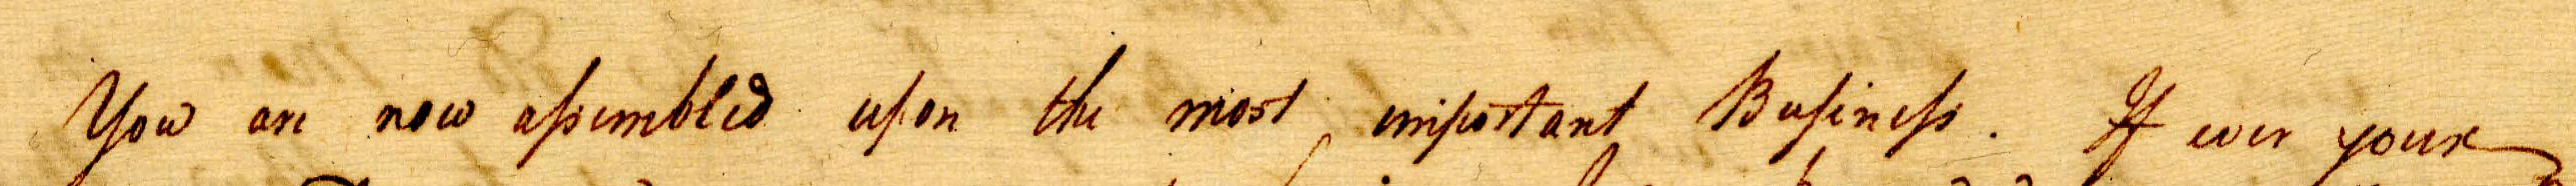You are now assembled upon the most important Business. If ever your
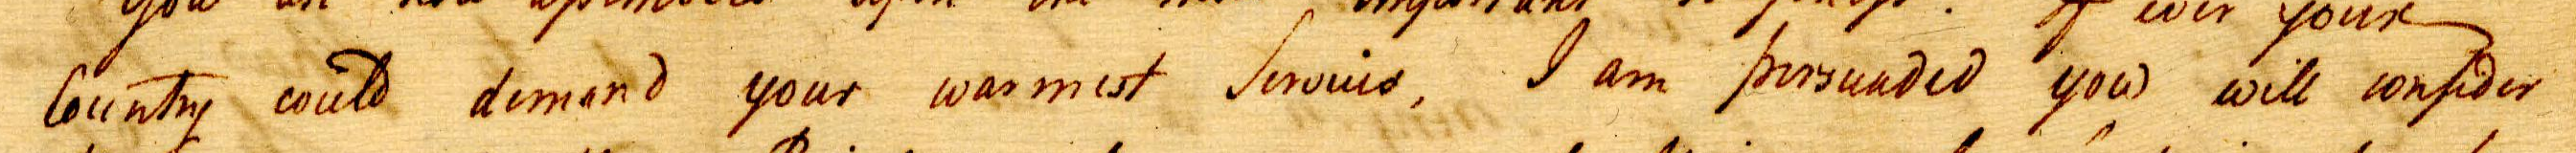Country could demand your warmest Services, I am persuaded you will consider
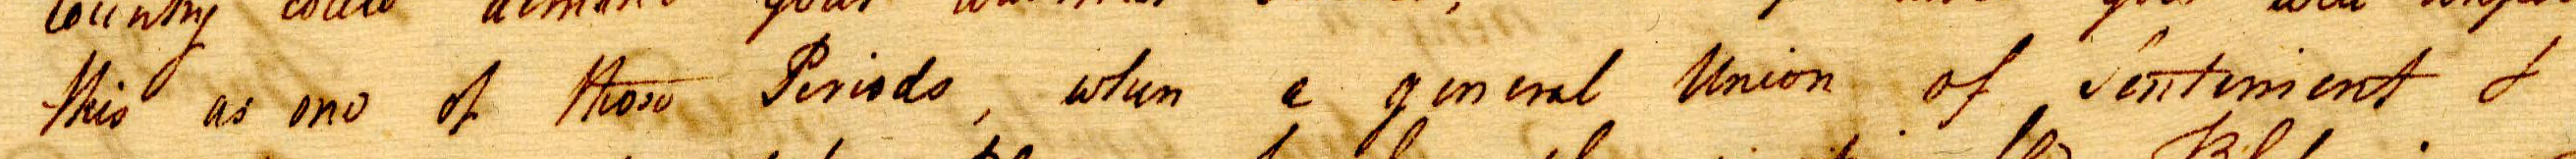this as one of those Periods, when a general Union of Sentiment &
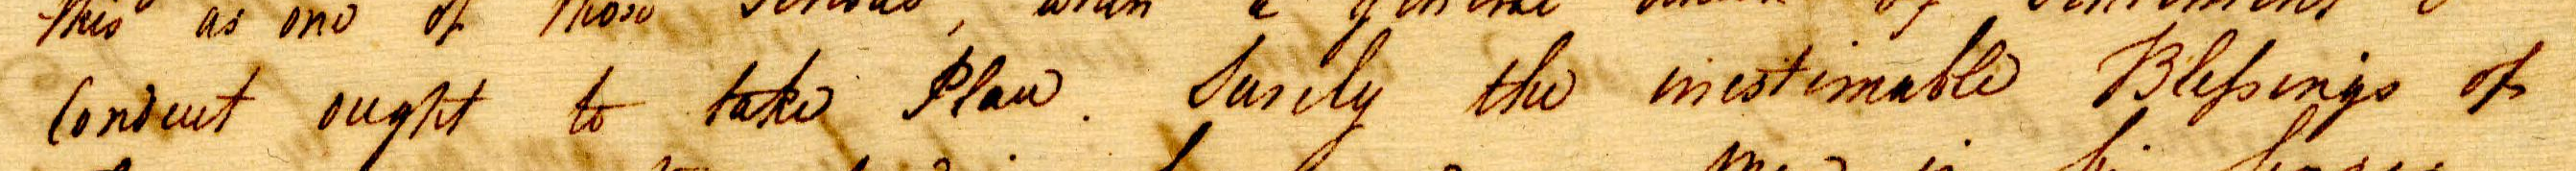Conduct ought to take Place. Surely, the inestimable Blessings of
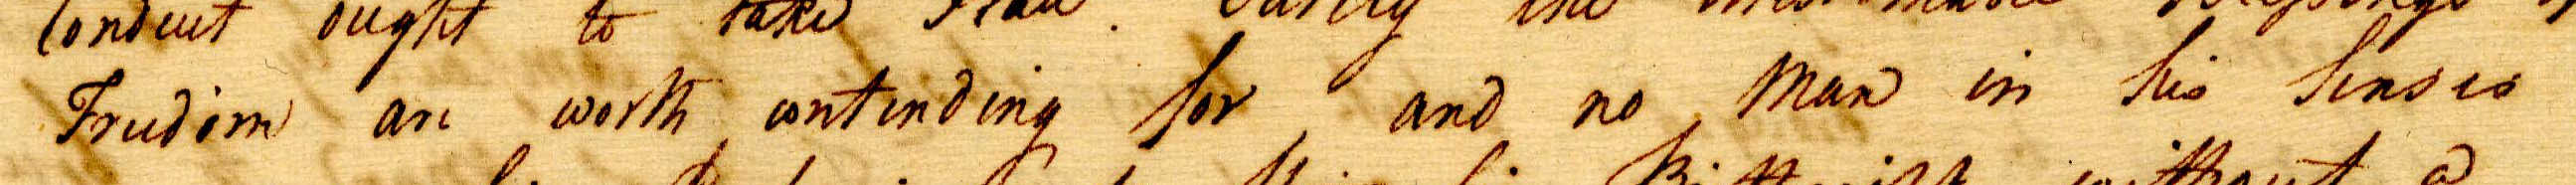Freedom are worth contending for and no Man in his Senses
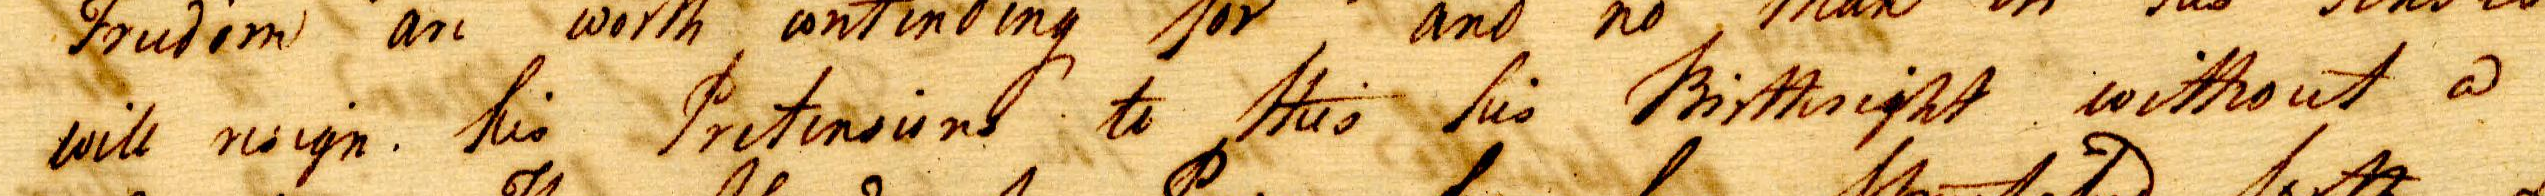will resign his Pretensions to this his Birthright without a
